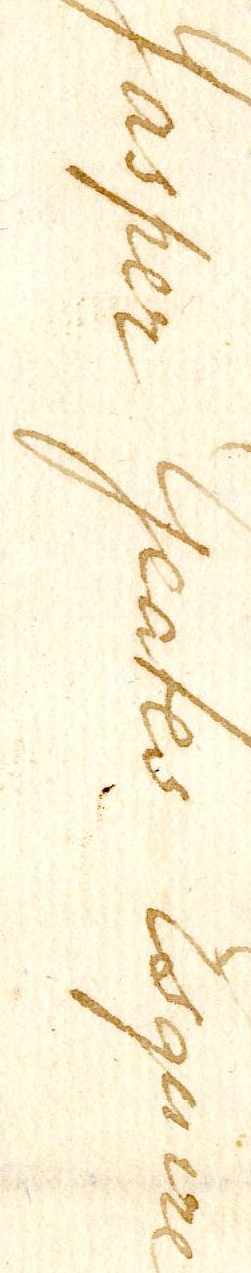Jasper Yeates Esquire
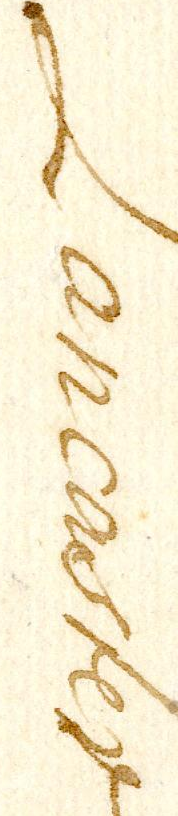Lancaster
